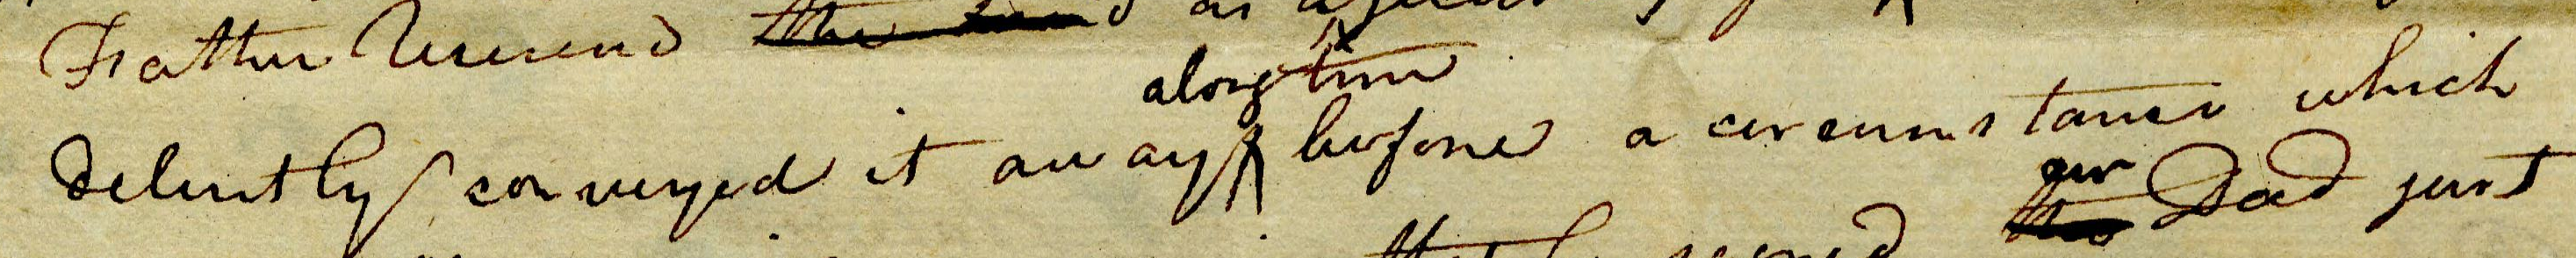deluntly conveyed it away ^ before a circumstance which
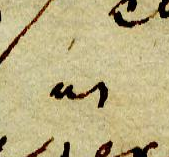us
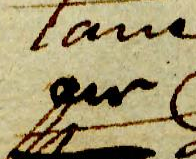our
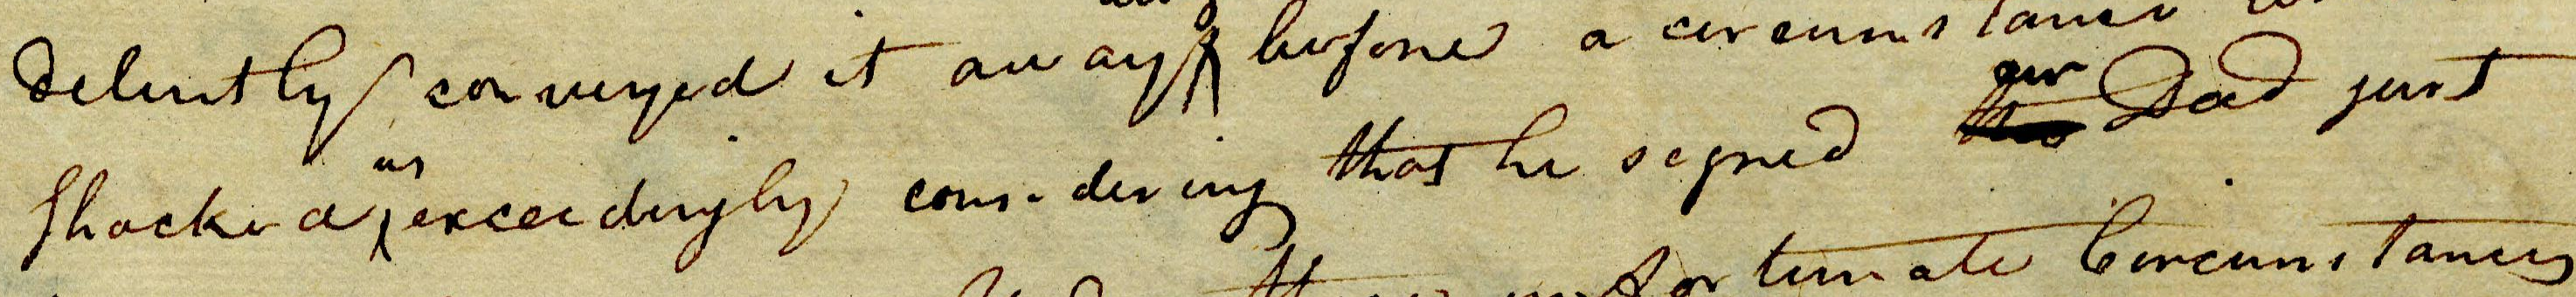shocked ^ exceedingly considering that he signed [the] Deed just
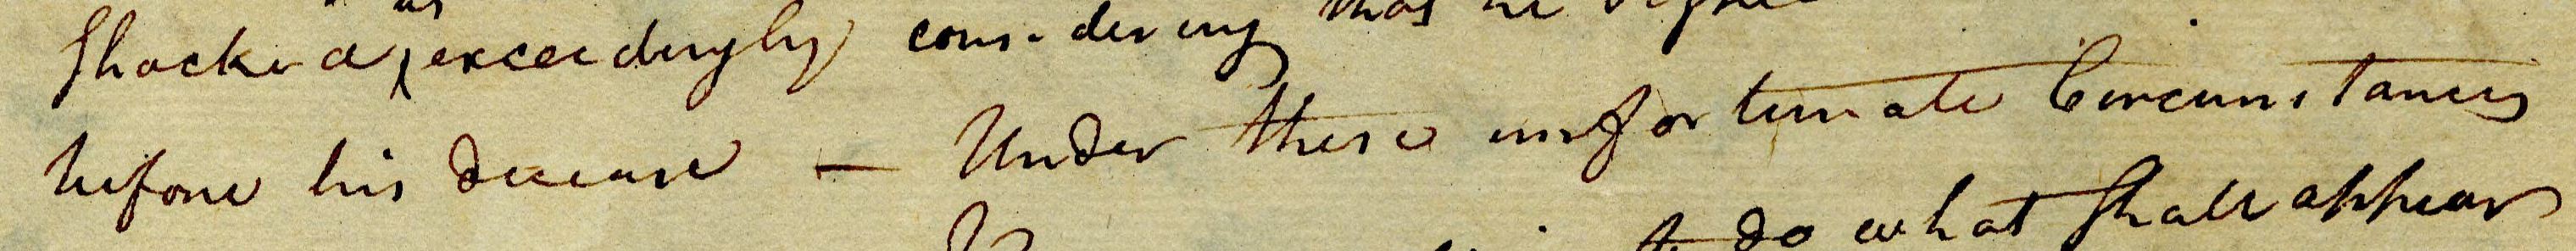before his decease - Under these unfortunate Circumstances
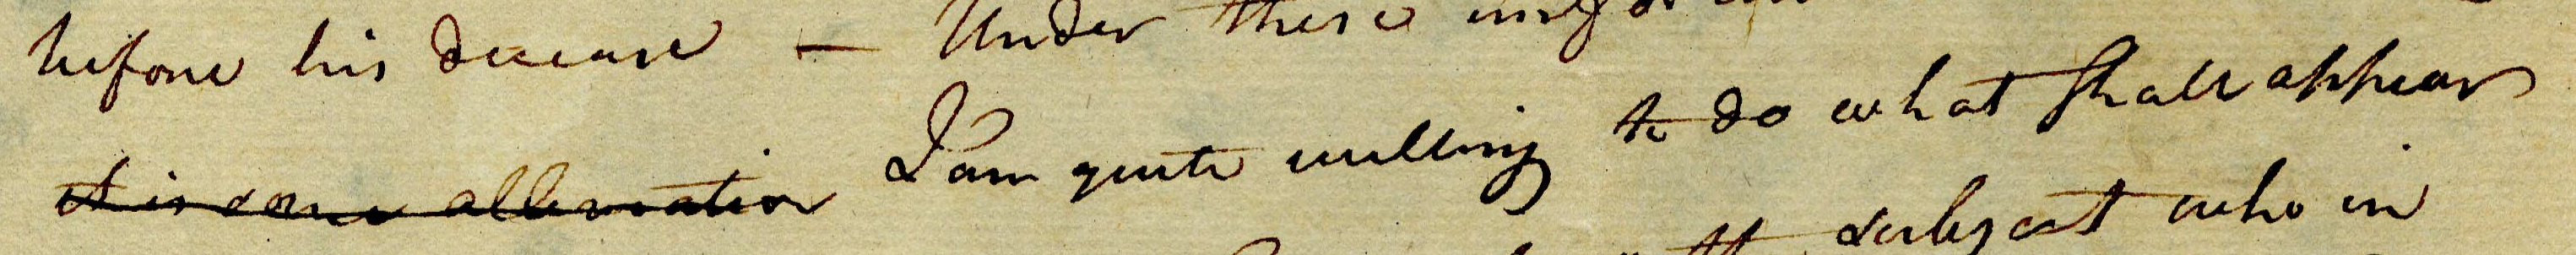[it is one alleviation] I am quite willing to do what shall appear
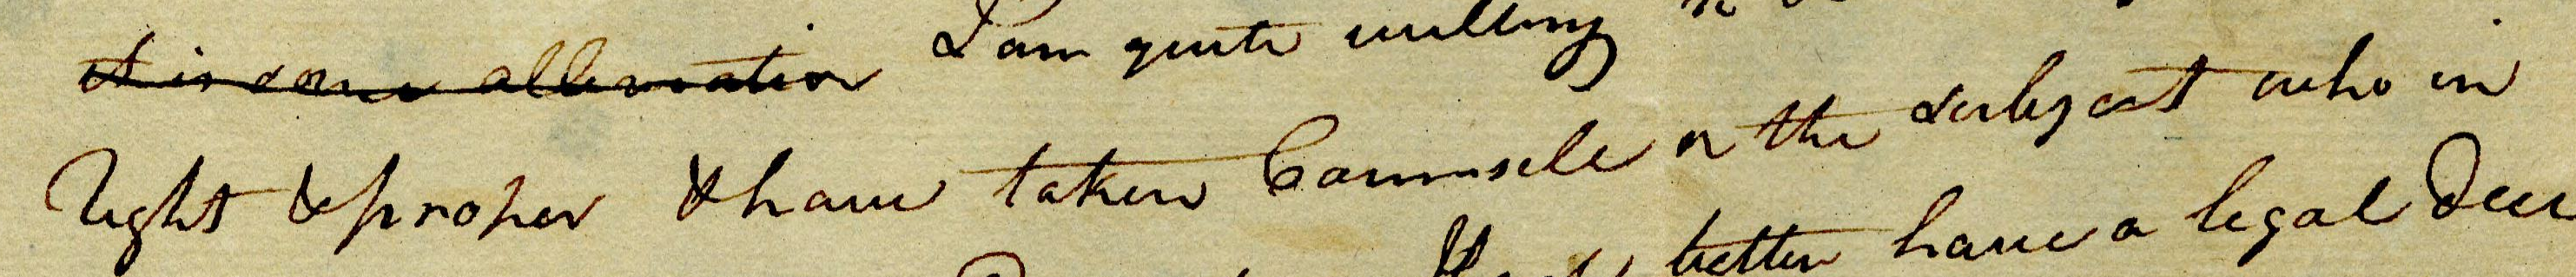right & proper & have taken Counsell in the duty at who in
